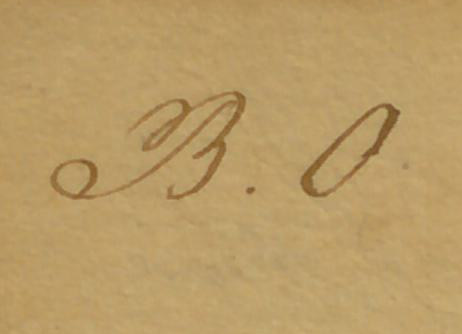B.O
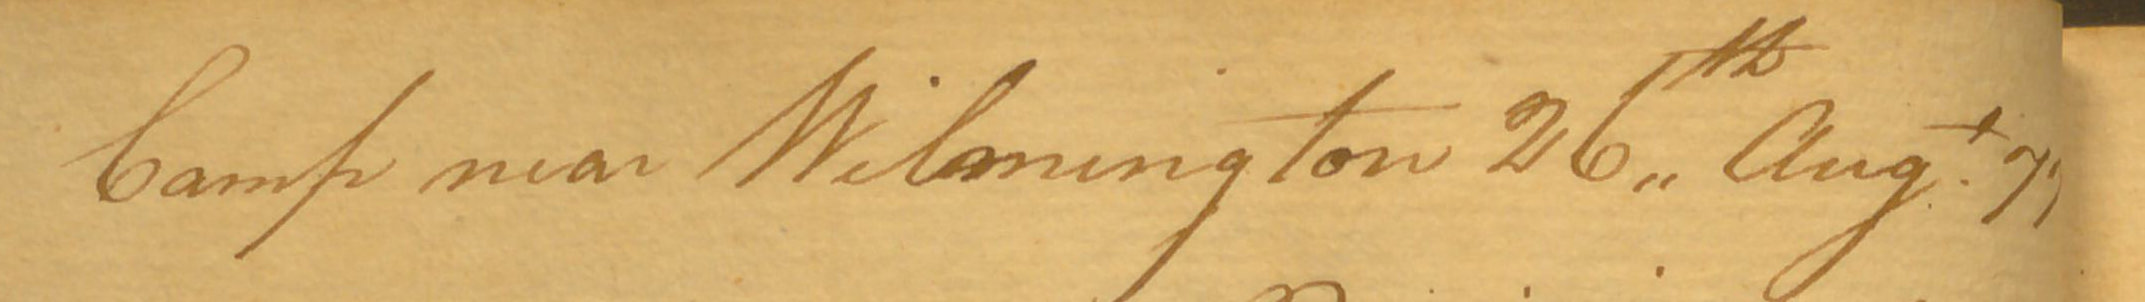Camp near Wilmington 26^th. Aug^t. 77
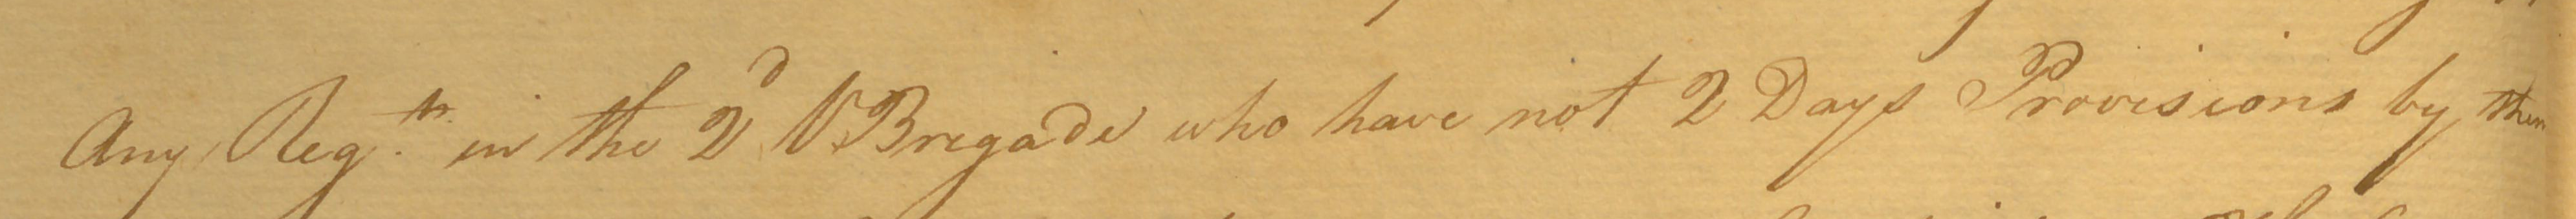Any Reg^t. in the 2^d V Brigade who have not 2 Days Provisions by them
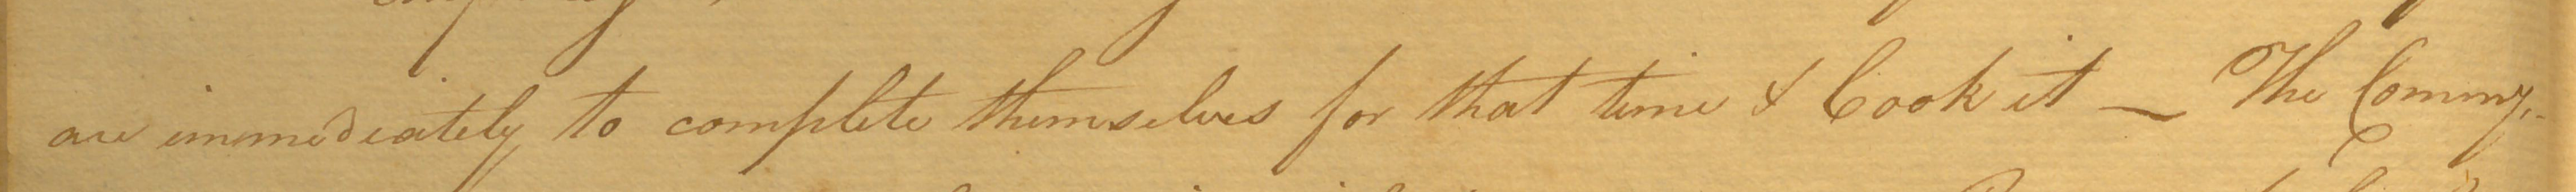are immediately to complete themselves for that time & Cook it- The Comm^y
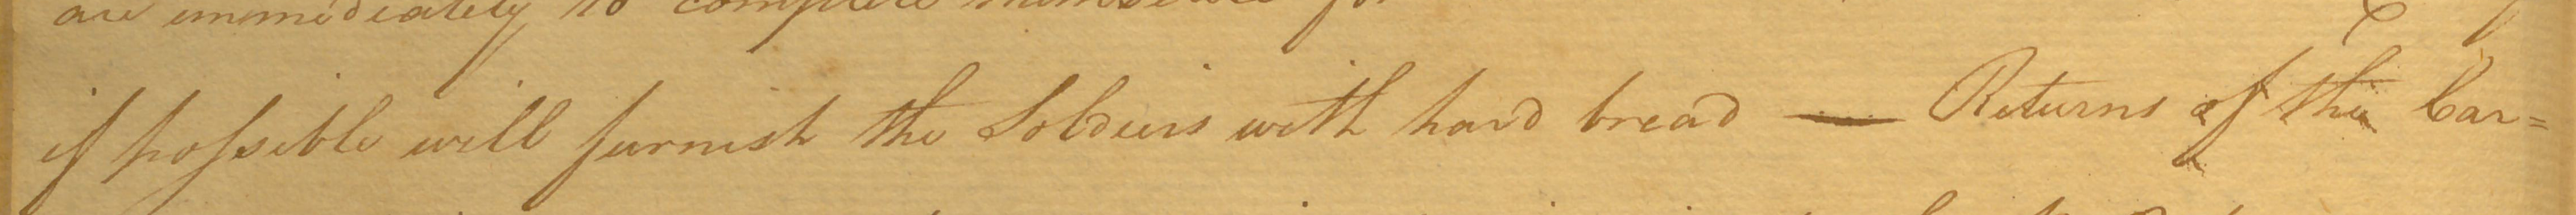if possible will furnish the Soldiers with hard bread- Returns of the Car-
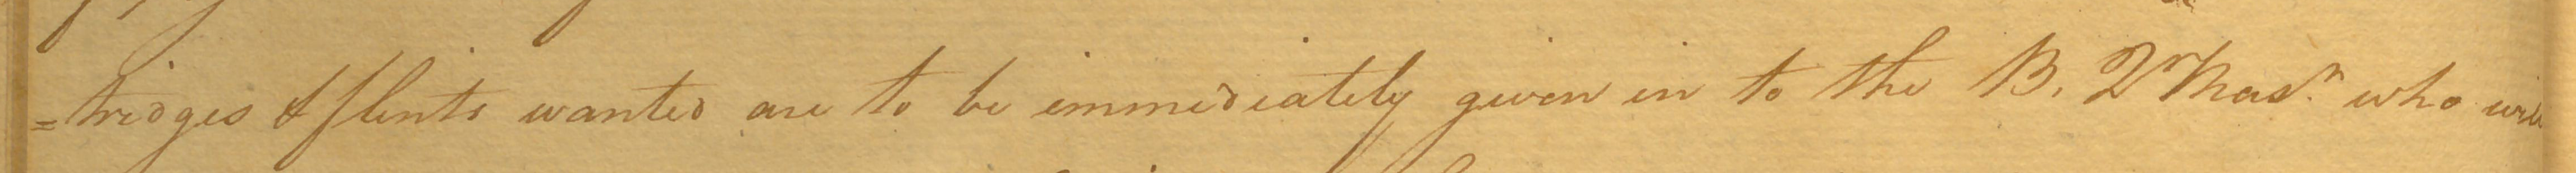-tridges of flints wanted are to be immediately given in to the B. Q^r Mas^r. who will
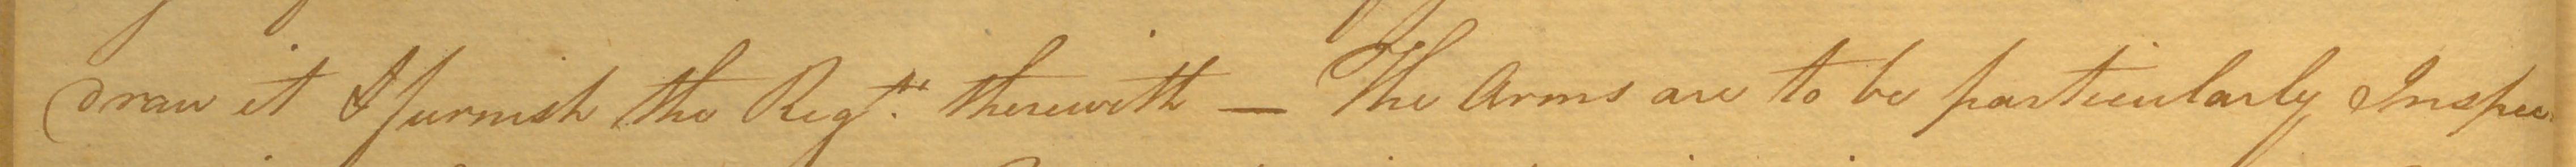draw it & furnish the Reg^ts. therewith- The Arms are to be particularly Inspec
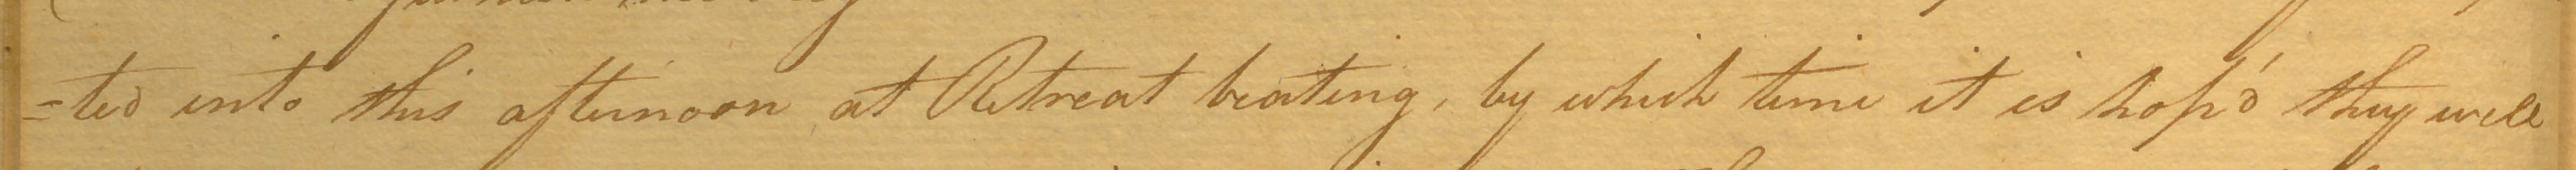-ted into this afternoon at Retreat beating, by which time it is hop'd they will
